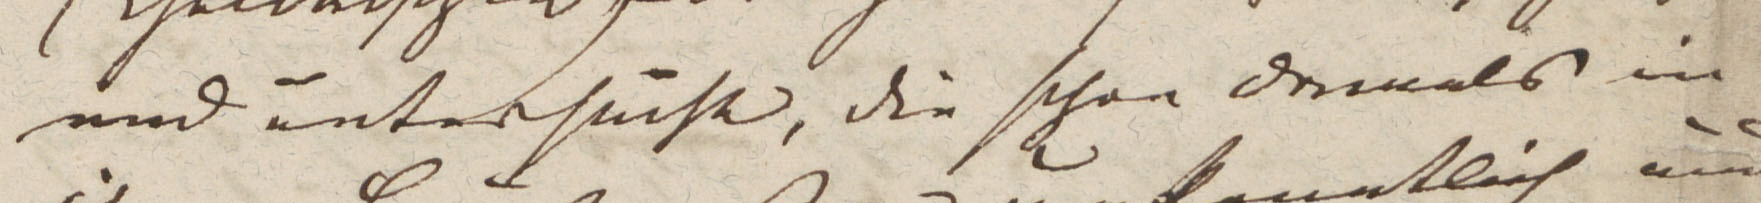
und untersucht, die schon damals in
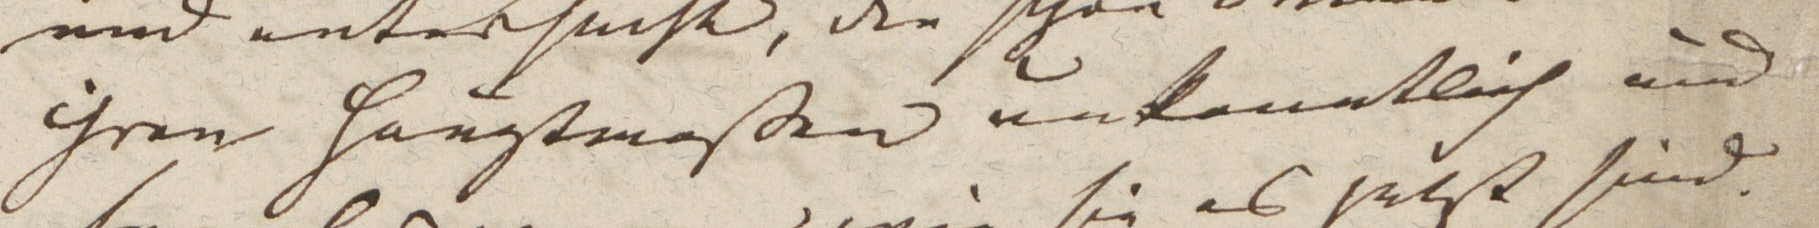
ihren Hauptmassen unkenntlich und
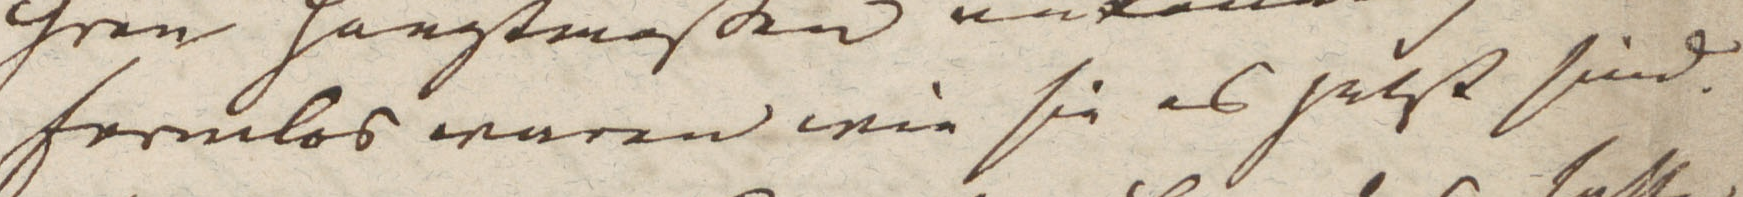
formlos waren wie sie es jetzt sind.
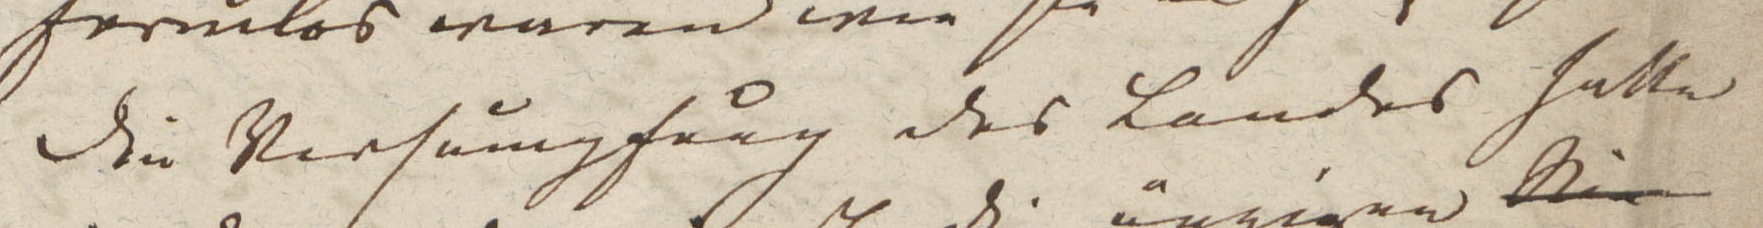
Die Versumpfung des Landes hatte
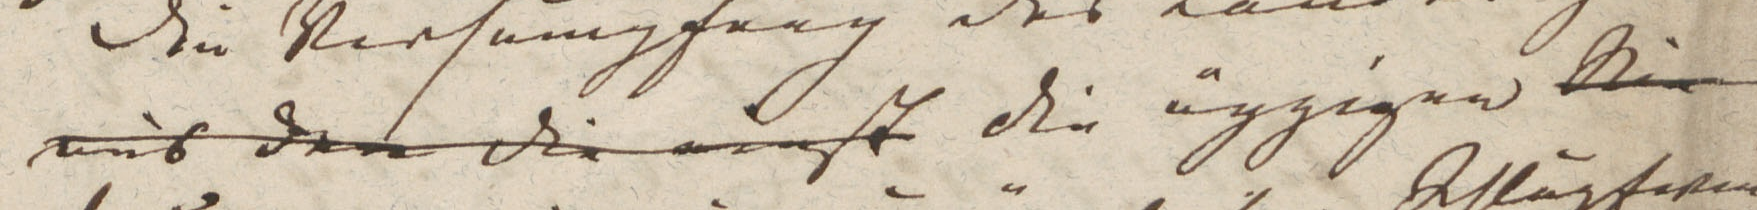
aus den die einst die üppigen Nie
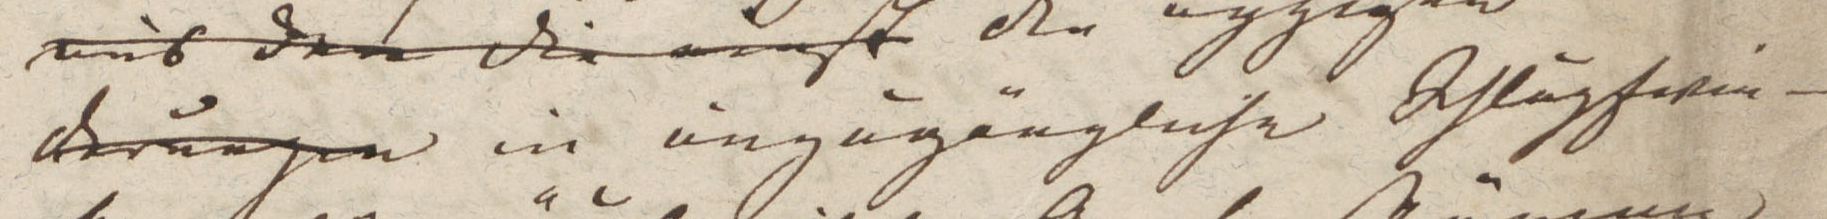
derungen in unzugängliche Schlupfwin-
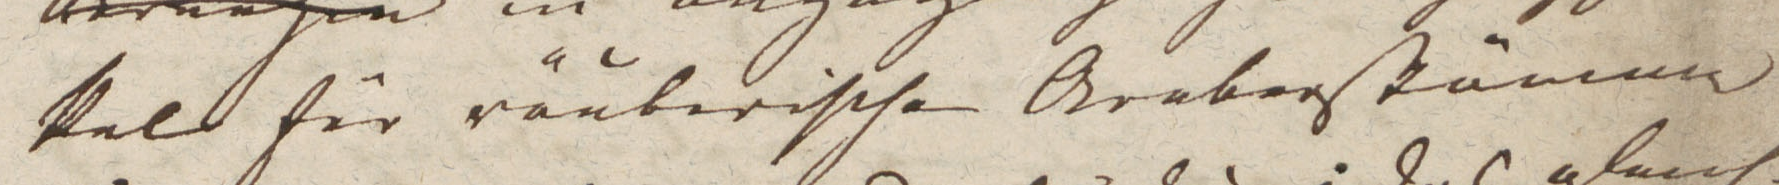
kel für räuberische Araberstämme
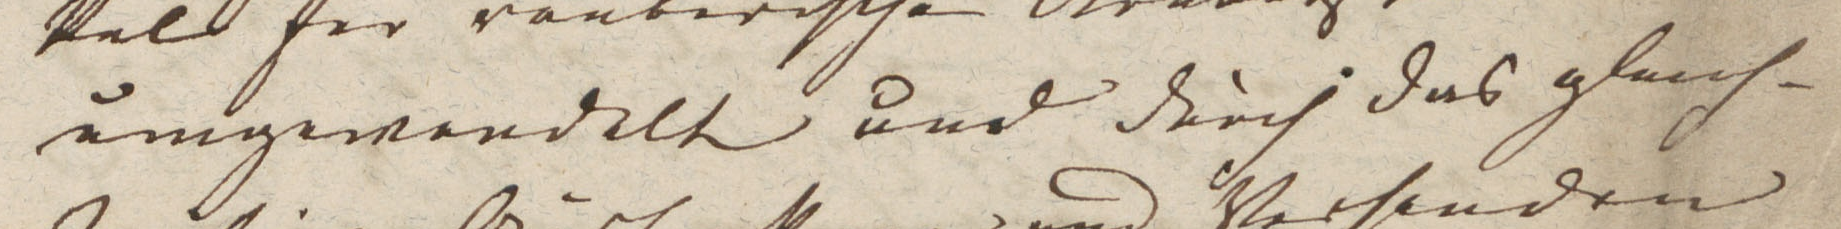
umgewandelt und durch das gleich-
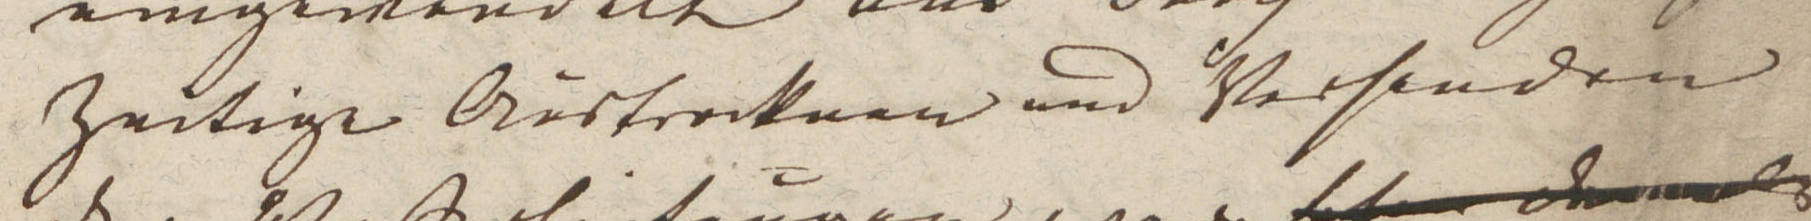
eitige Austrocknen und Versenden
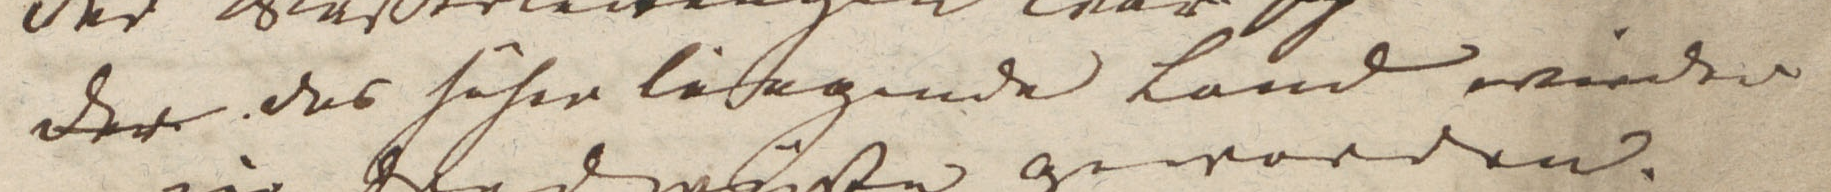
der das höher liegende Land wieder
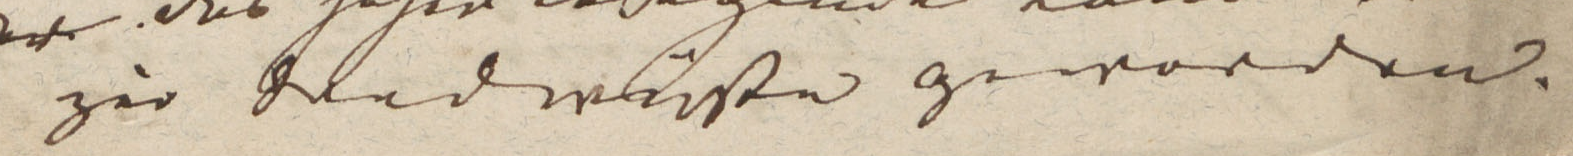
zur Sandwüste geworden.
